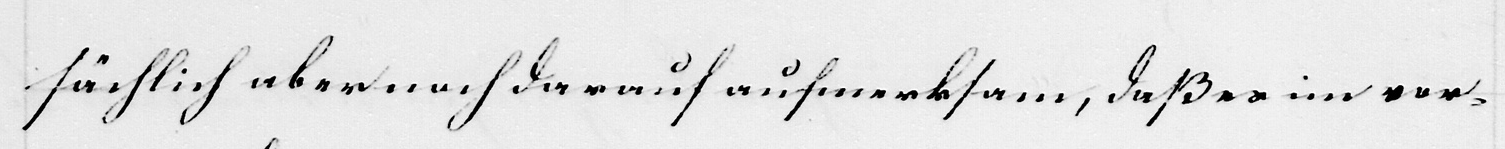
sächlich aber noch darauf aufmerksam, daß es im vor¬
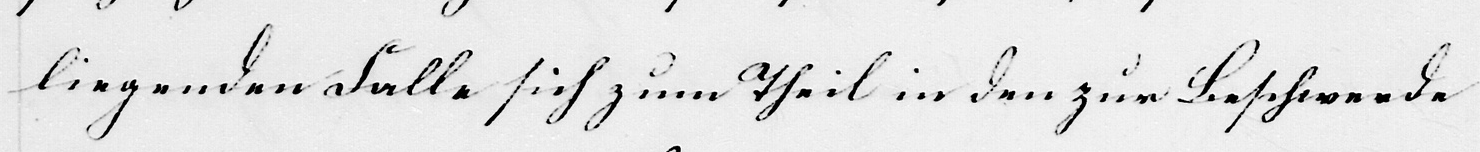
liegenden Falle sich zum Theil in den zur Beschwerde
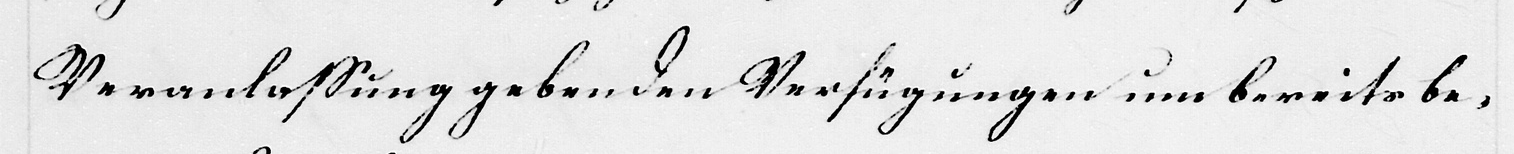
Veranlaßung gebenden Verfügungen um bereits be¬
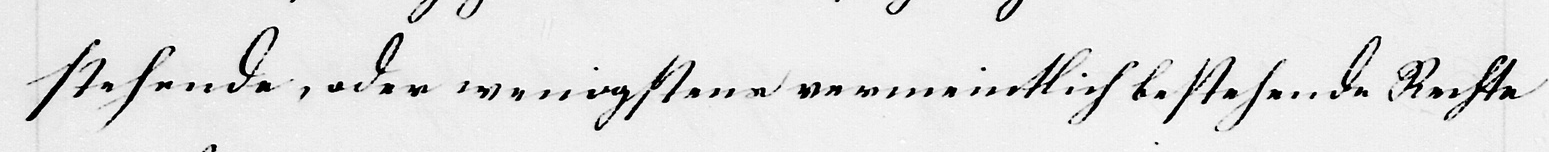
stehende, oder wenigstens vermeintlich bestehende Rechte
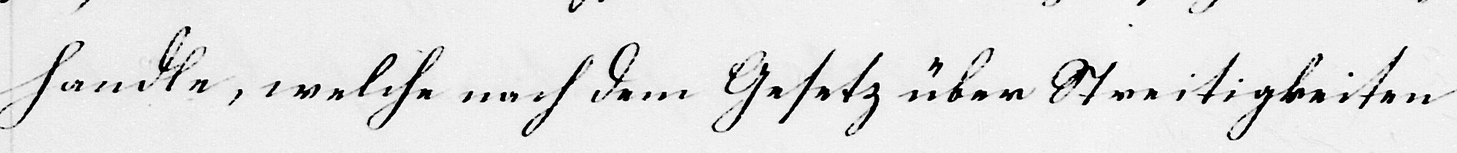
handle, welche nach dem Gesetz über Streitigkeiten
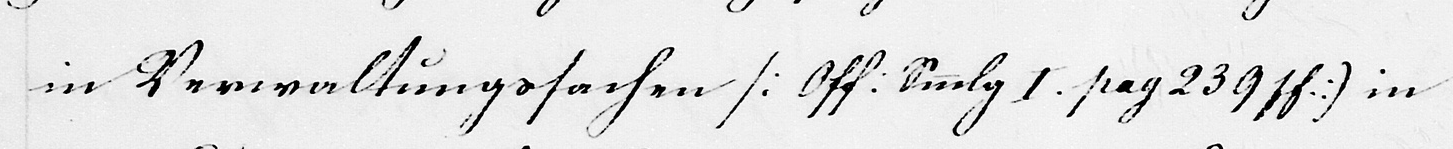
in Verwaltungssachen [Off: Smmlg I. pag 239 ff.] in
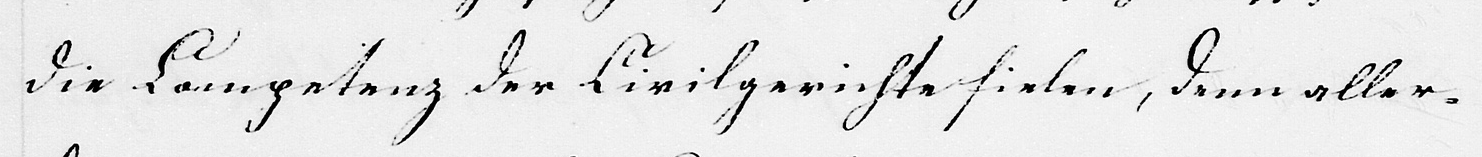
die Competenz der Civilgerichte fielen, denn aller¬
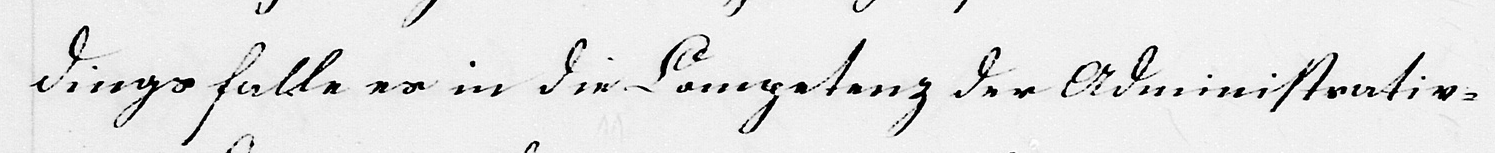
dings falle es in die Competenz der Administrativ¬
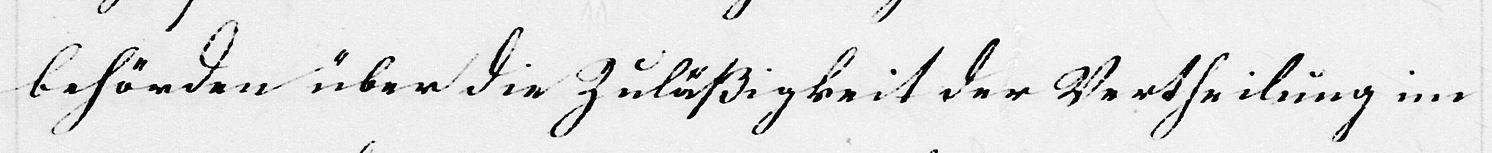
behörden über die Zuläßigkeit der Vertheilung im
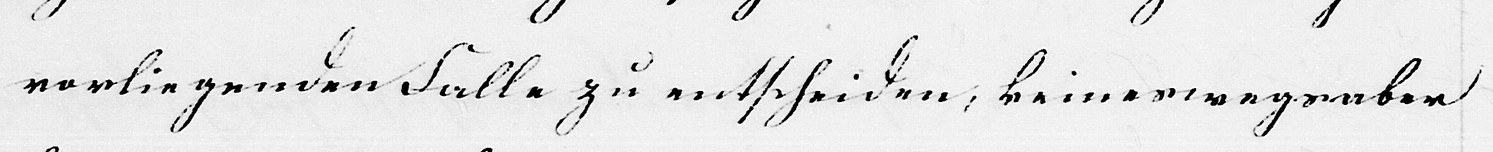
vorliegenden Falle zu entscheiden, keineswegs aber
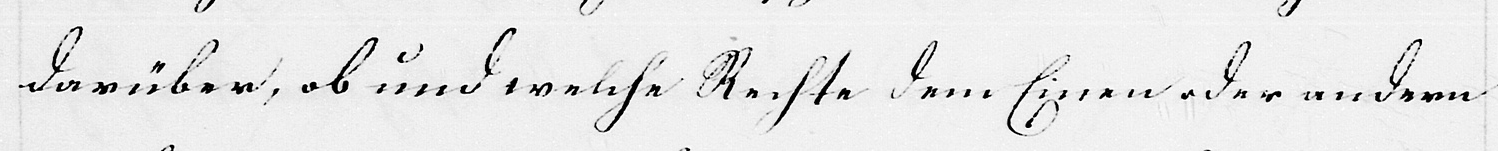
darüber, ob und welche Rechte dem Einen oder andern
